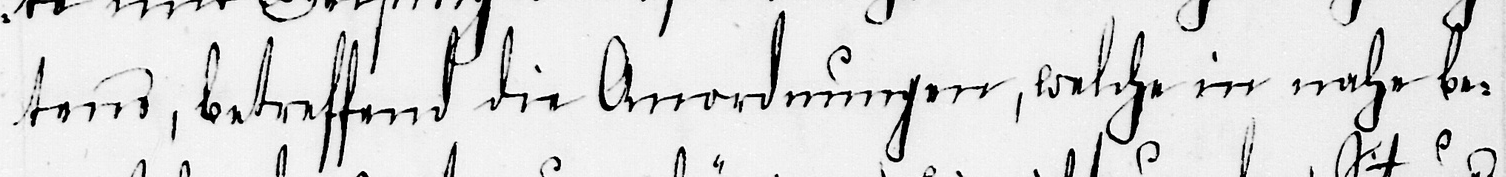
tens, betreffend die Anordnungen, welche in nahe be¬
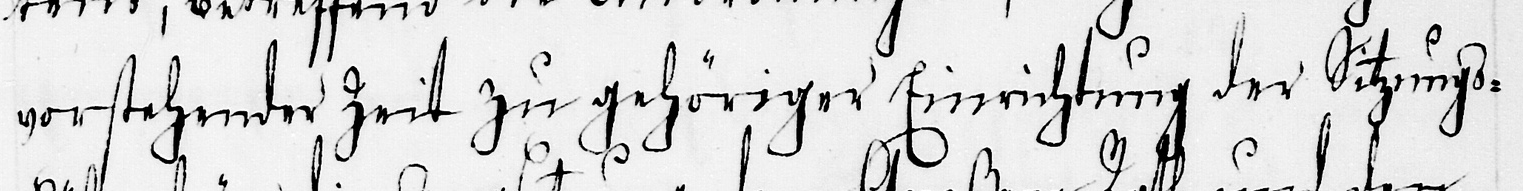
vorstehender Zeit zu gehöriger Einrichtung der Sitzungs¬
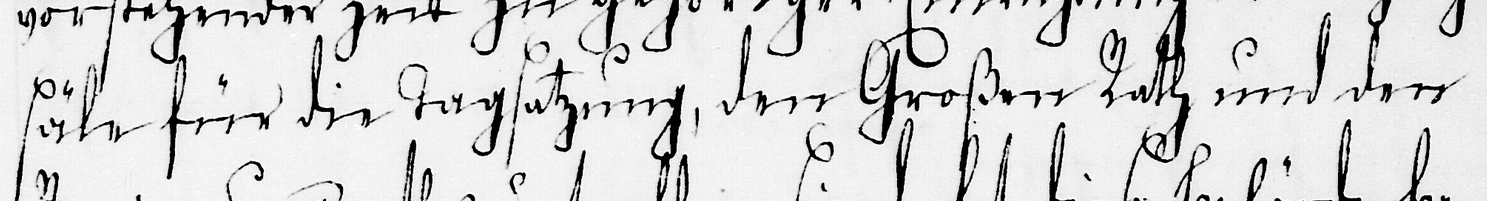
säle für die Tagsatzung, den Großen Rath und den
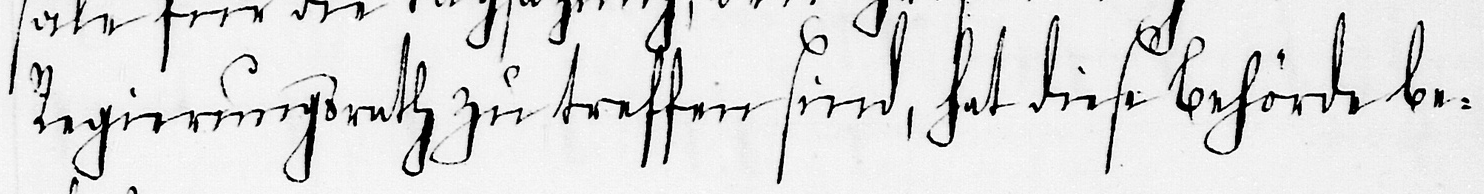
Regierungsrath zu treffen sind, hat diese Behörde be¬
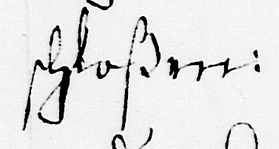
schloßen:
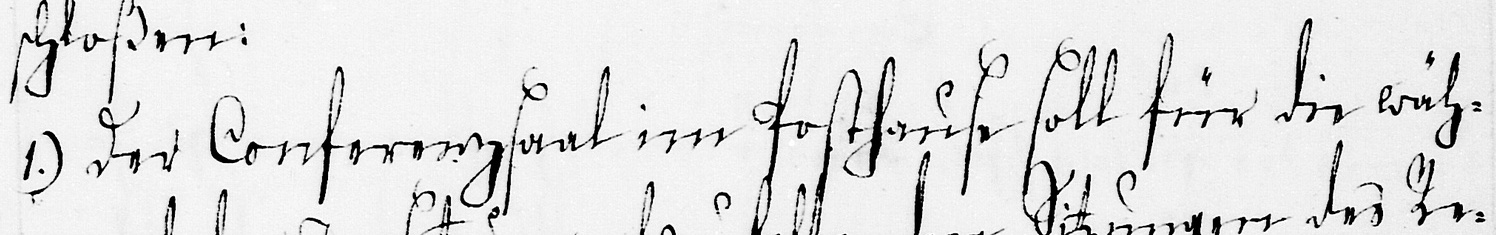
1.) Der Conferenzsaal im Posthause soll für die wäh¬
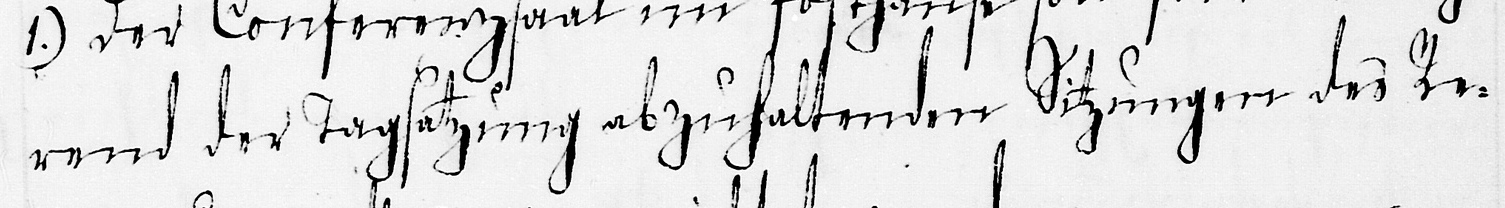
rend der Tagsatzung abzuhaltenden Sitzungen des Re¬
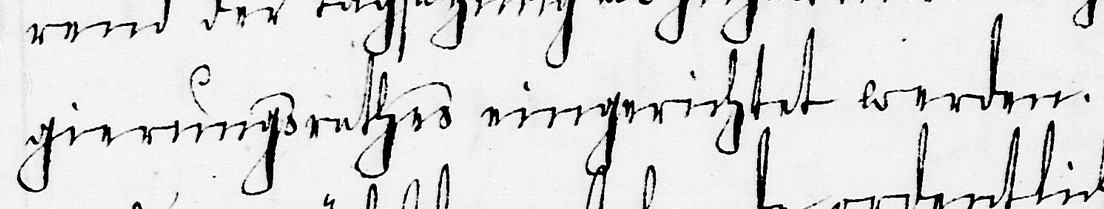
gierungsrathes eingerichtet werden.
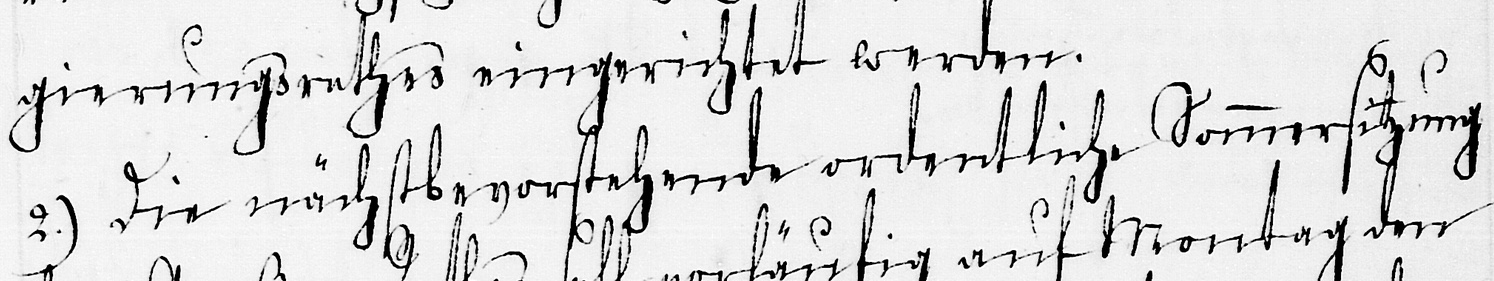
2.) Die nächstbevorstehende ordentliche Sommersitzung
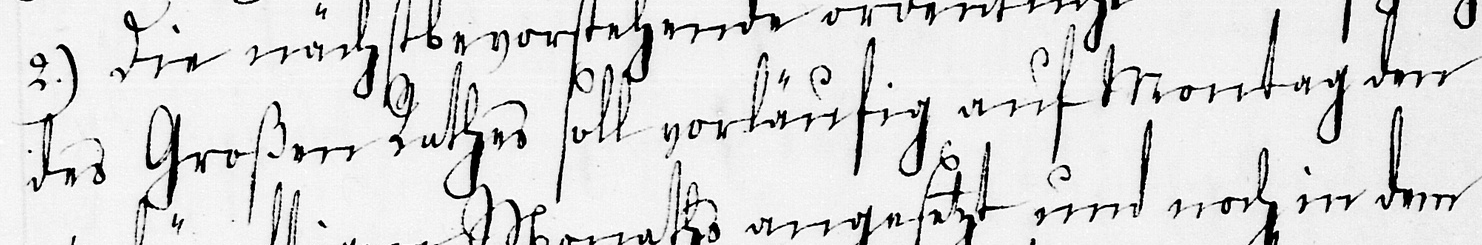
des Großen Rathes soll vorläufig auf Montag den
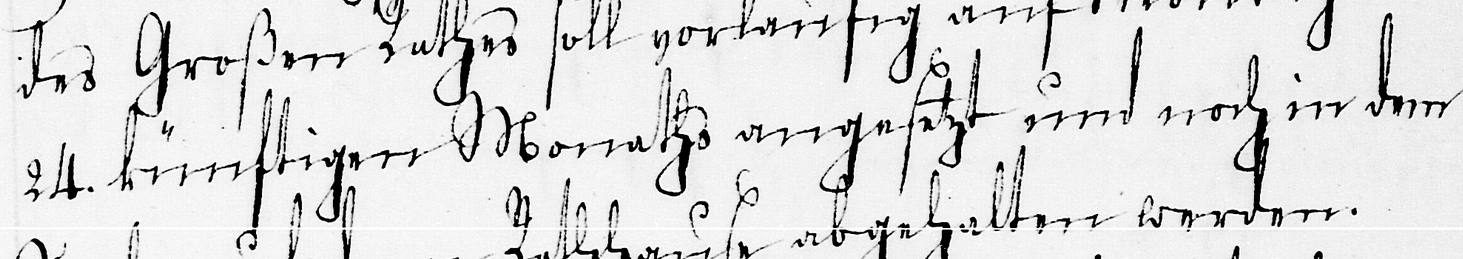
24. künftigen Monaths angesetzt und noch in dem
